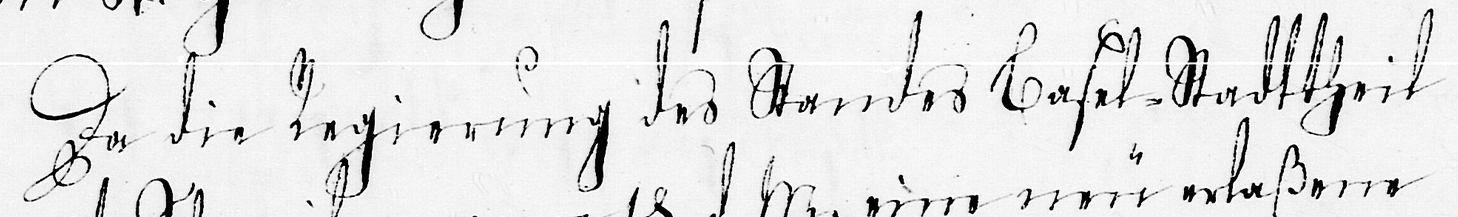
Da die Regierung des Standes Basel-Stadttheil
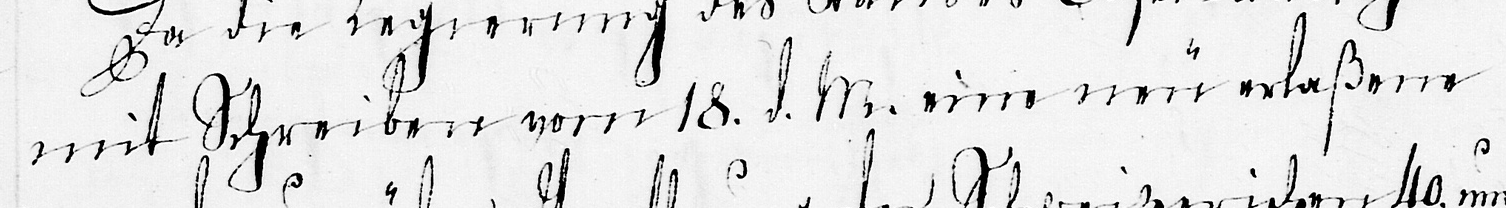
mit Schreiben vom 18. d. M. eine neu erlaßene
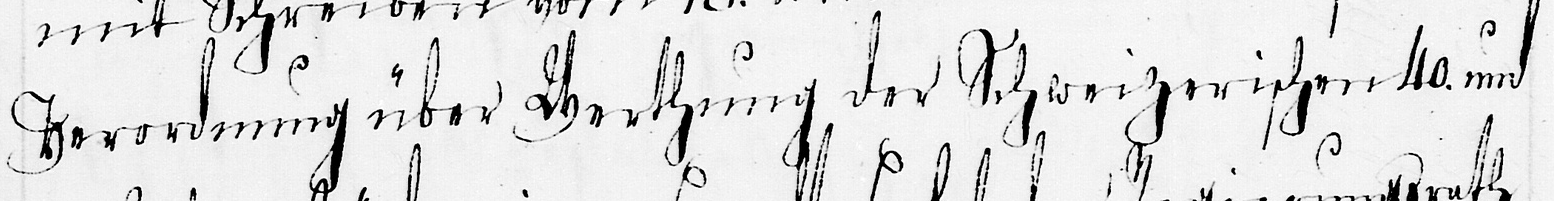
Verordnung über Werthung der Schweizerischen 40. und
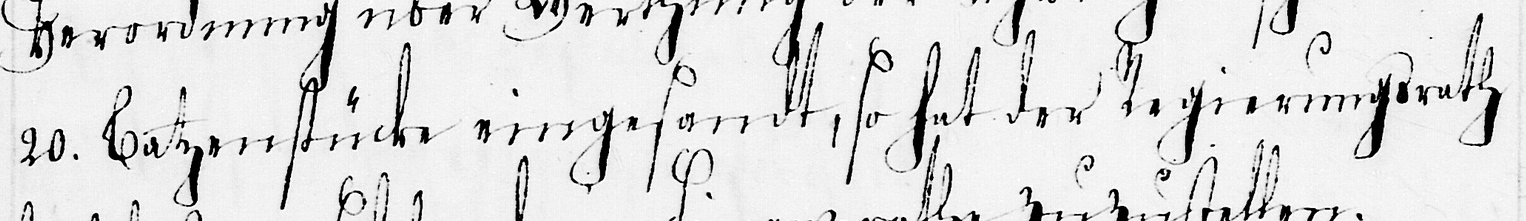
20. Batzenstücke eingesandt, so hat der Regierungsrath
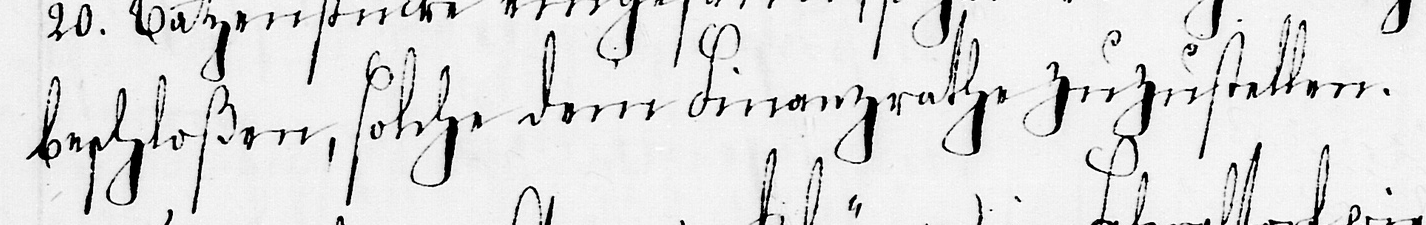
beschloßen, solche dem Finanzrathe zuzustellen.
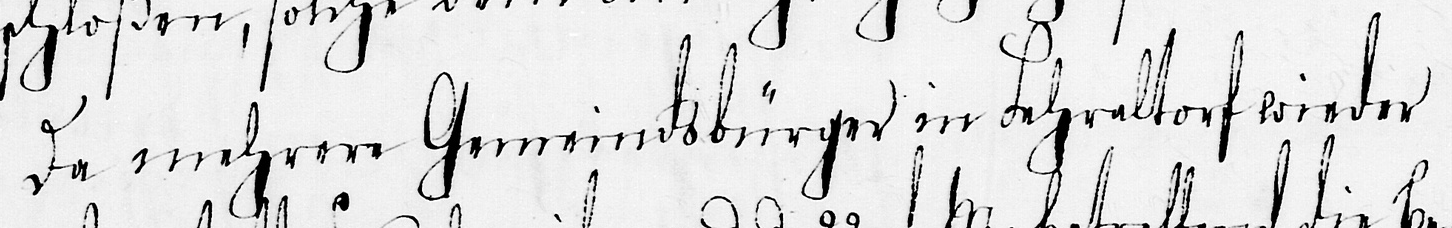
Da mehrere Gemeindsbürger in Fehraltorf wieder
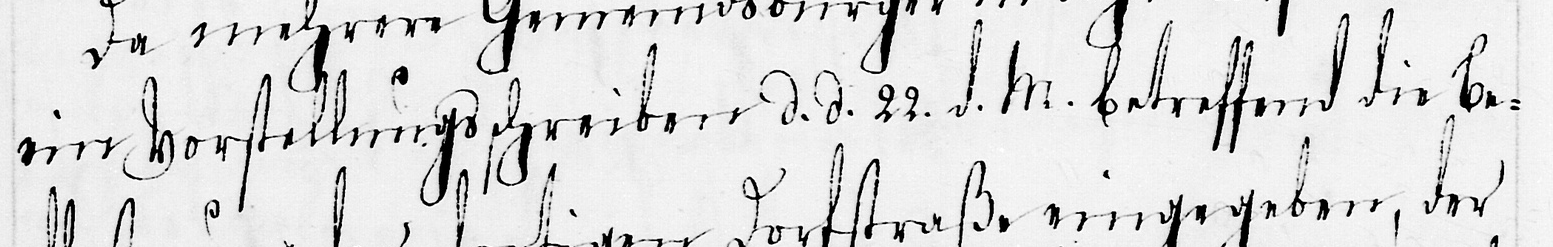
ein Vorstellungsschreiben d. d. 22. d. M. betreffend die Be¬
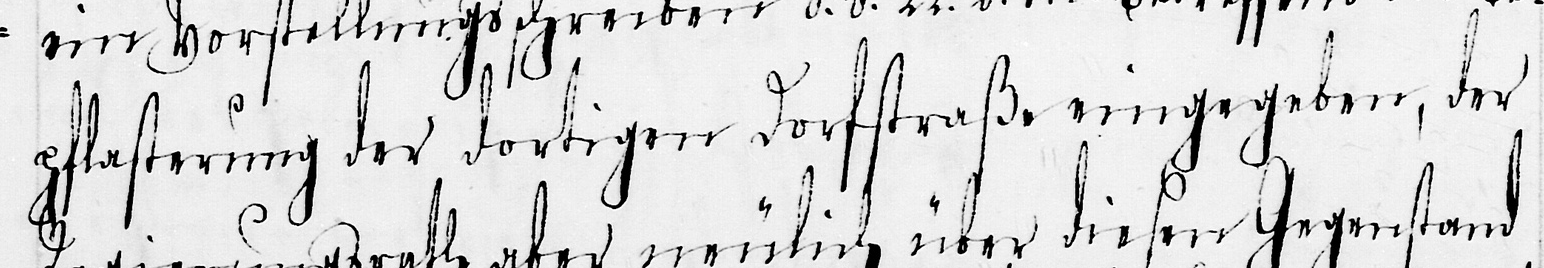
pflasterung der dortigen Dorfstraße eingegeben, der
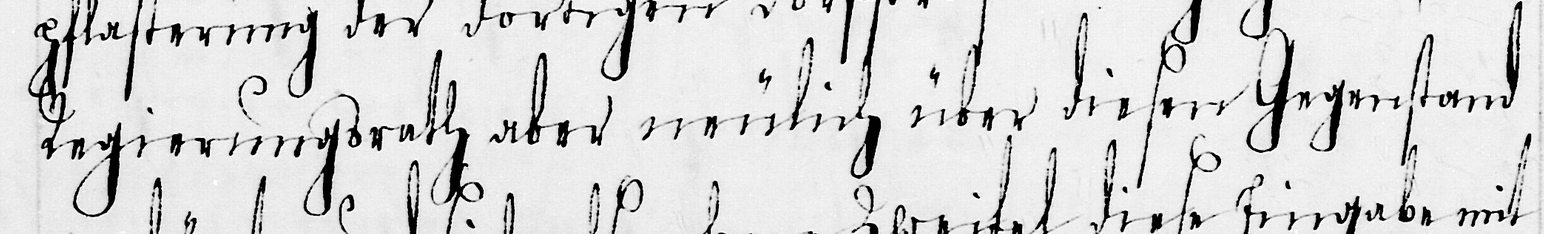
Regierungsrath aber neulich über diesen Gegenstand
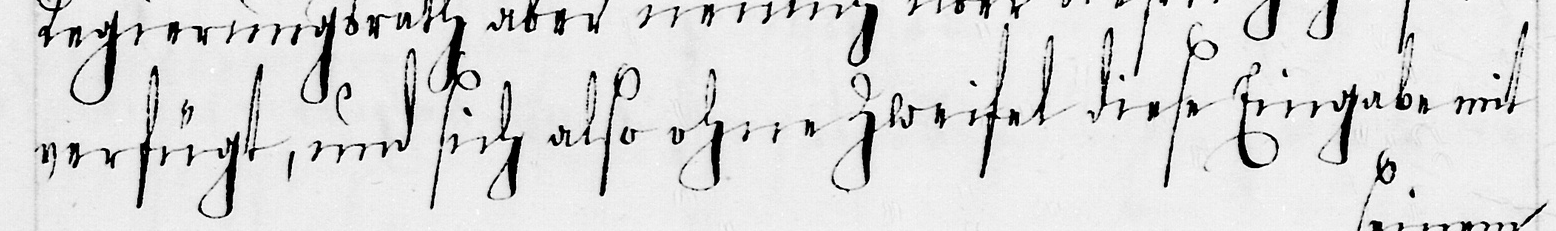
verfügt, und sich also ohne Zweifel diese Eingabe mit
